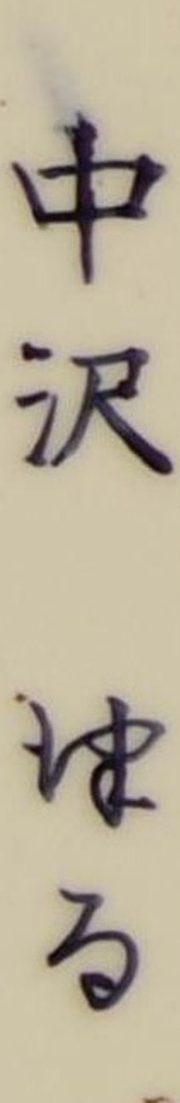中沢つる

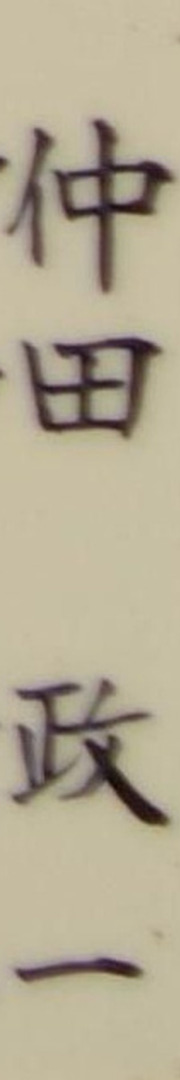仲田政一
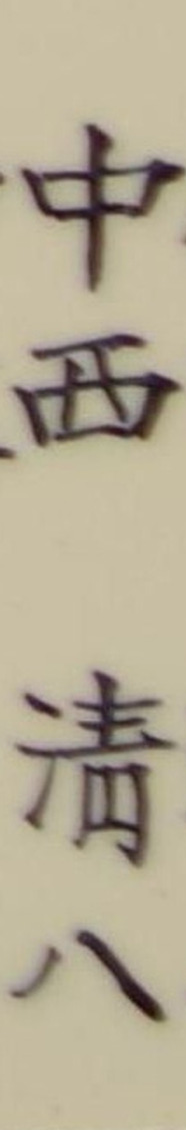中西清八
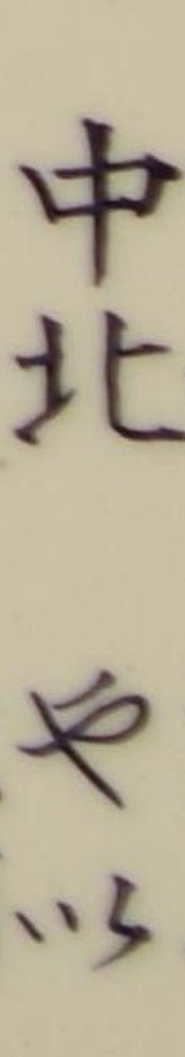中北やい
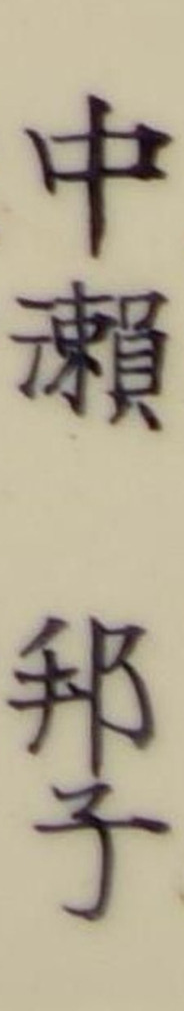中瀬邦子
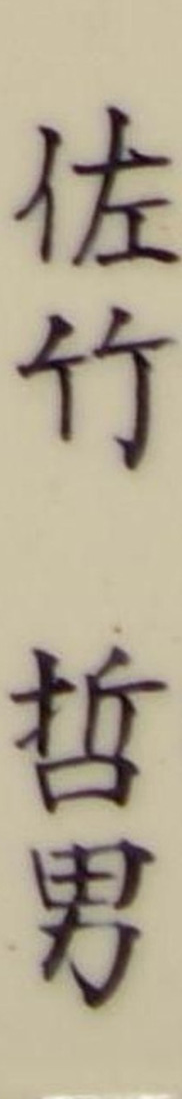佐竹哲男
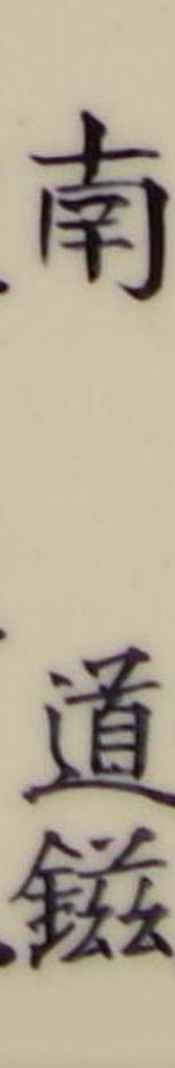南道鎡
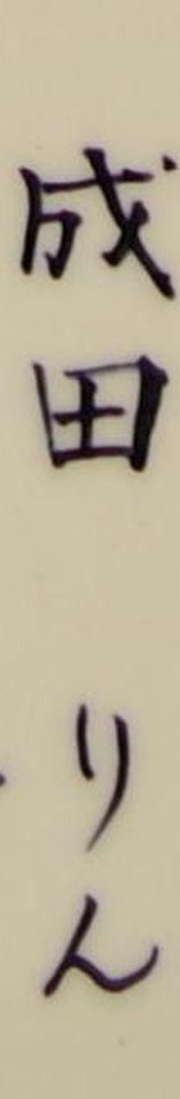成田りん
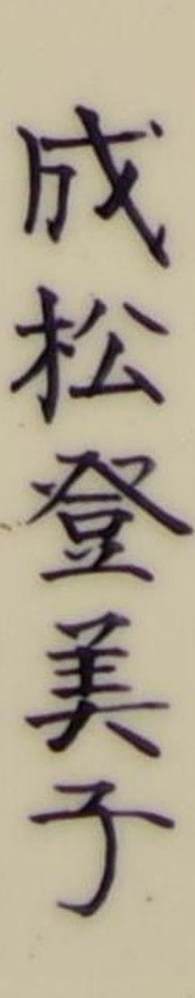成松登美子
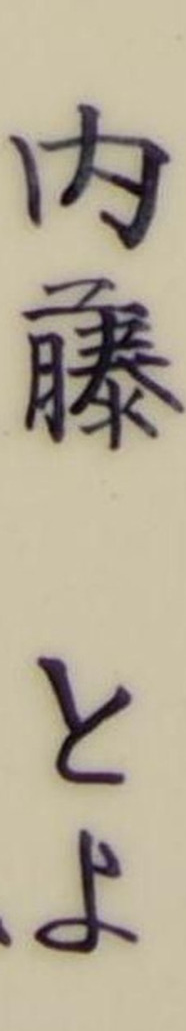内藤とよ
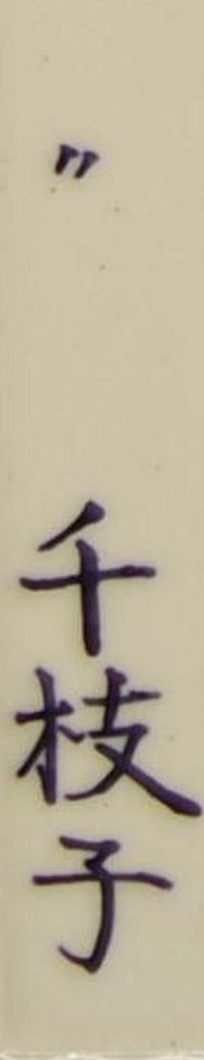千枝子
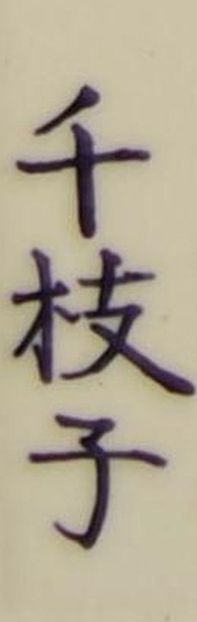千枝子

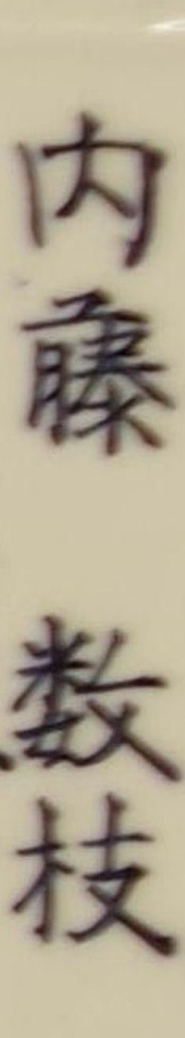内藤数枝
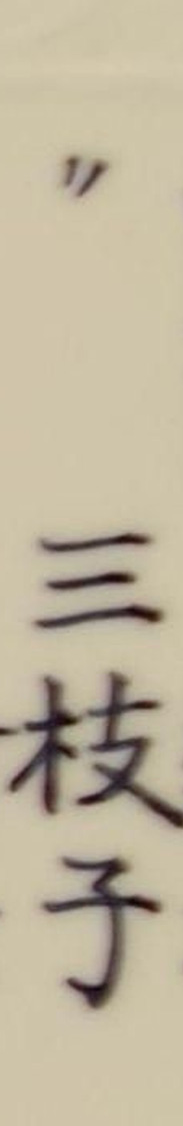三枝子
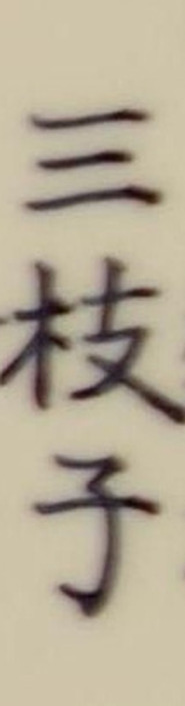三枝子
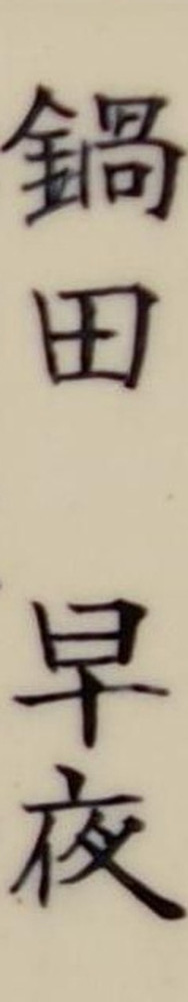鍋田早夜
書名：E~L
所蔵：高野山金剛峯寺
